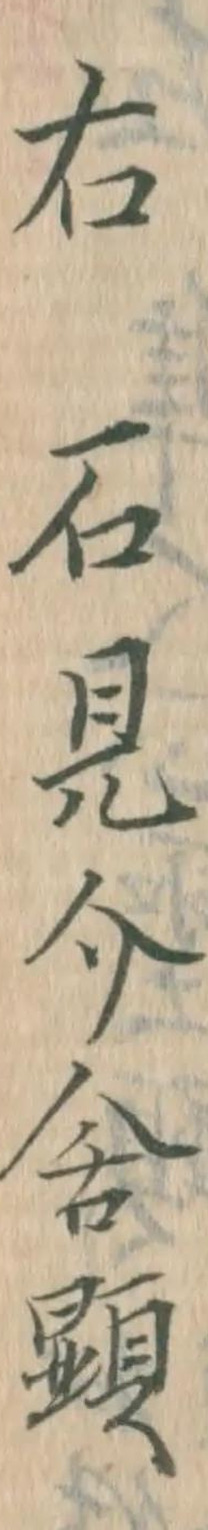右石見介舎顕

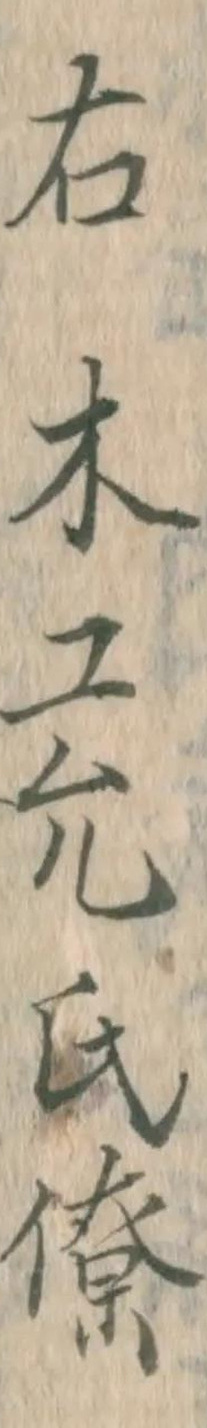右木工允氏僚
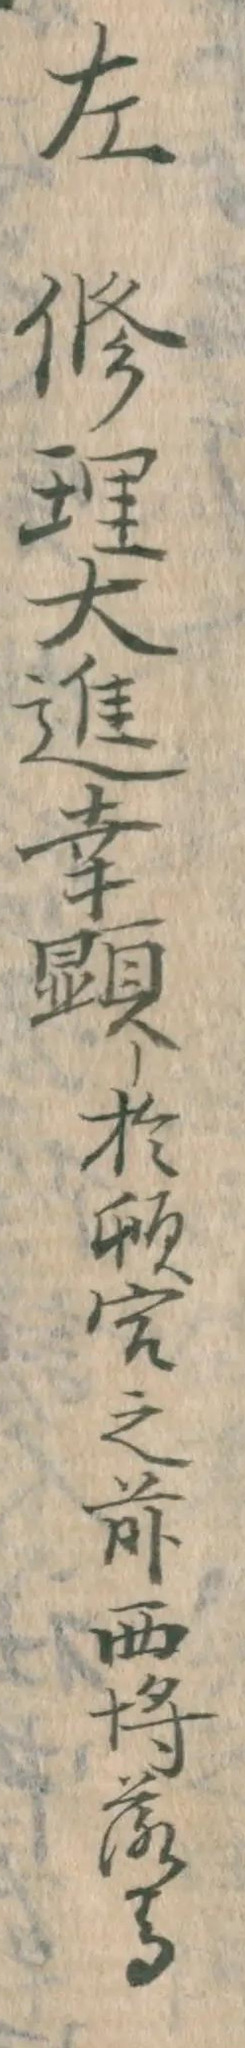左修理大進幸顕於頓穴之前西埒落馬
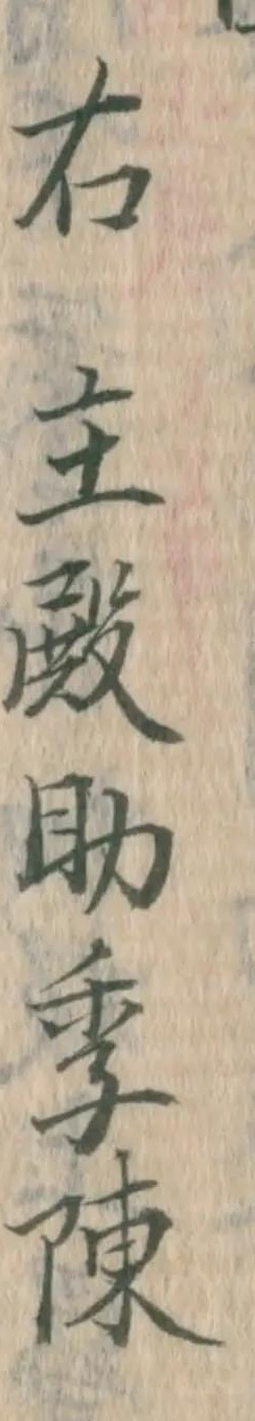右主殿助季陳
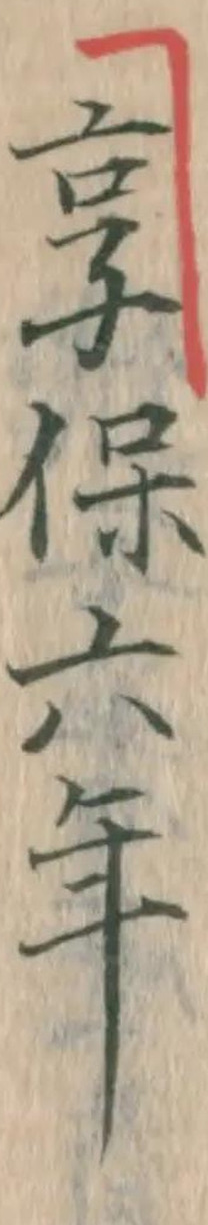享保六年
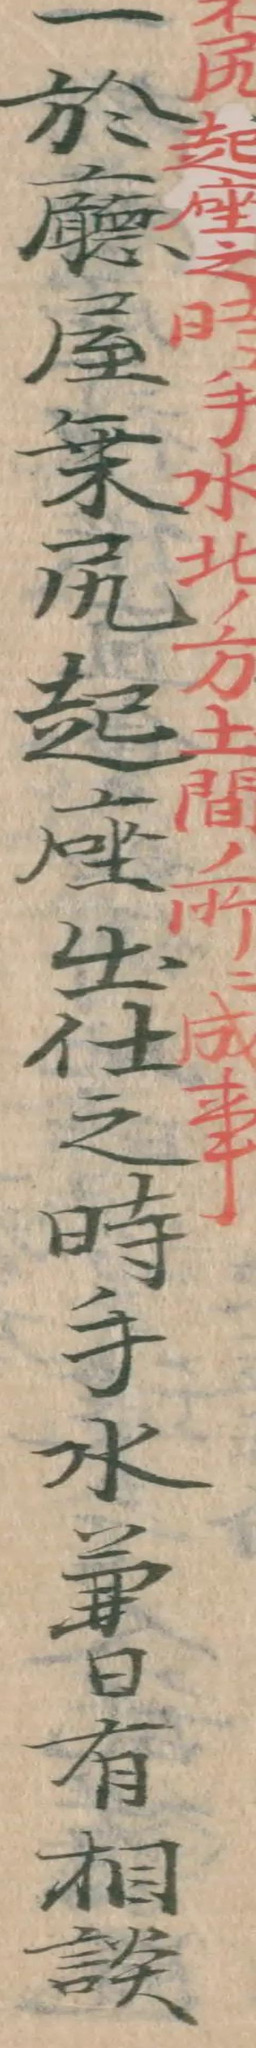一於庁屋乗尻起座出仕之時手水兼日有相談
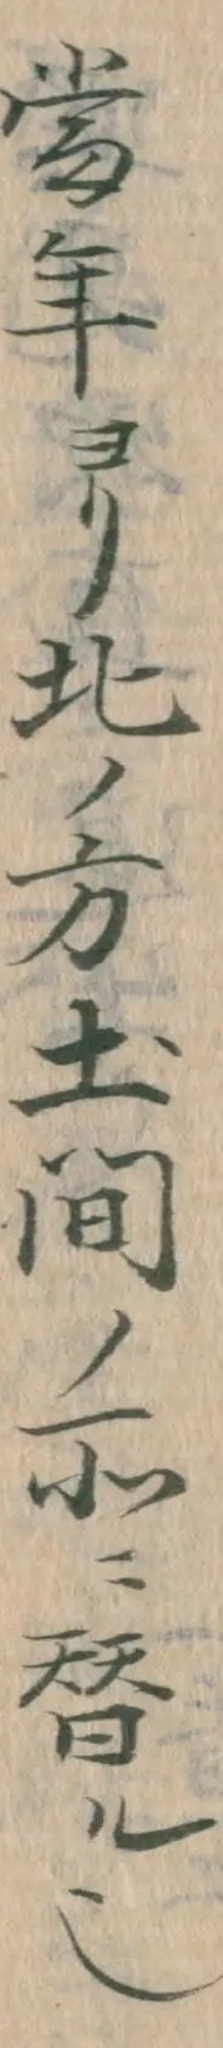当年ヨリ北ノ方土間ノ所ニ替ル也
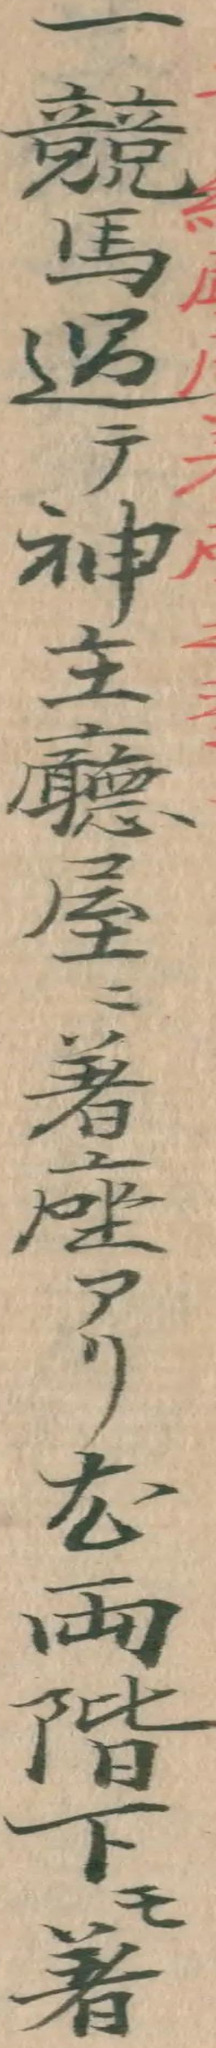一競馬過テ神主庁屋ニ着座アリ尤両階下モ着
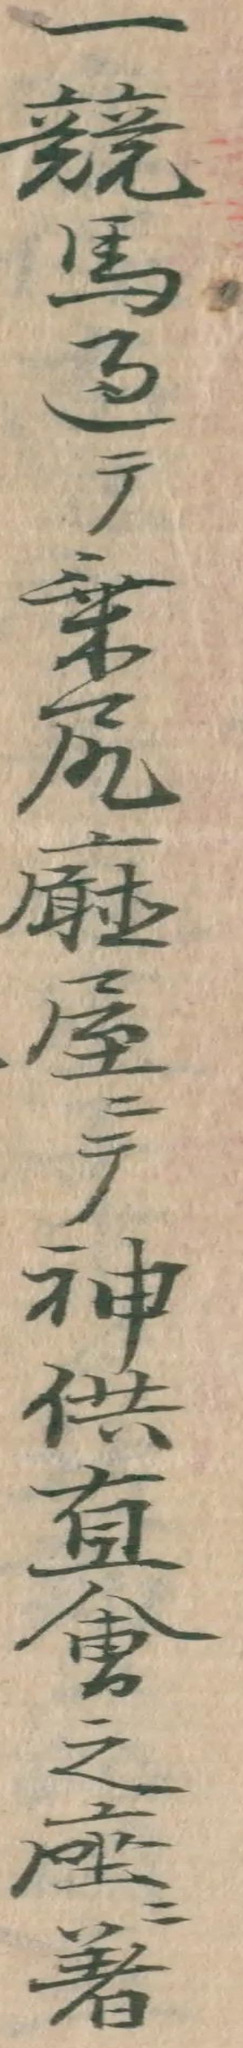一競馬過テ乗尻庁屋ニテ神供直会之座ニ着
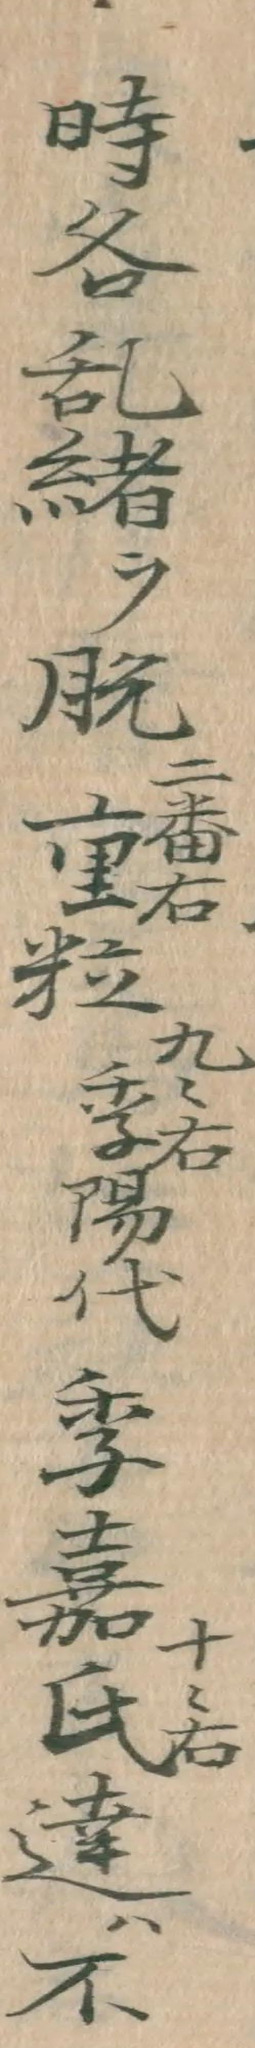時各乱緒ヲ脱重粒李陽代季嘉氏達ハ不

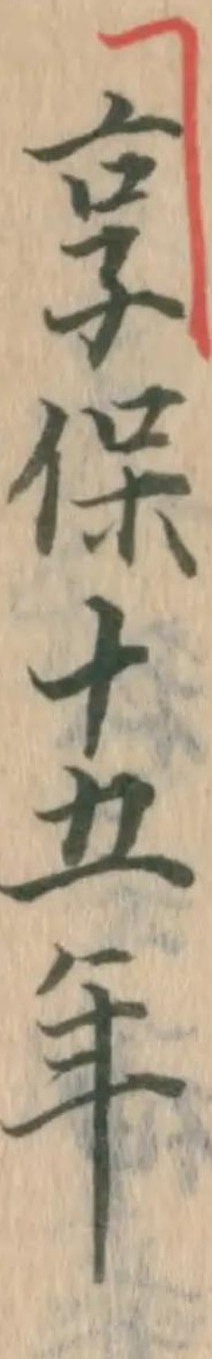享保十五年
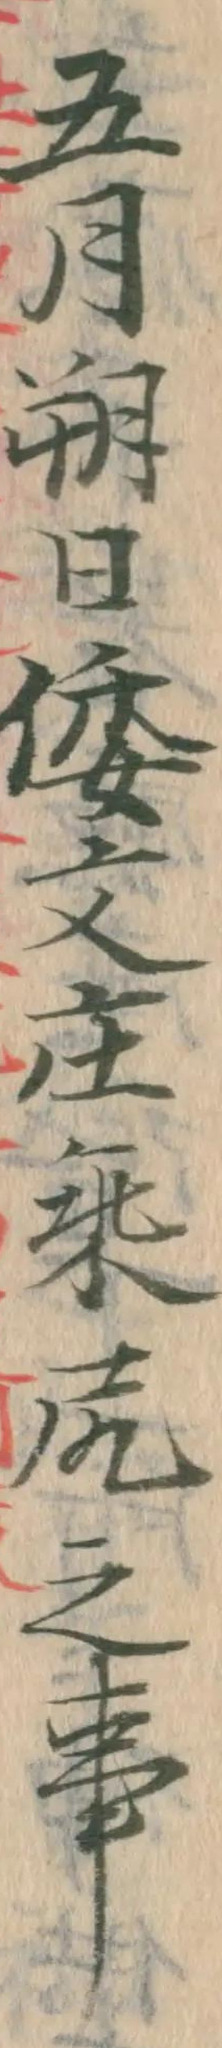五月朔日倭文庄乗尻之事
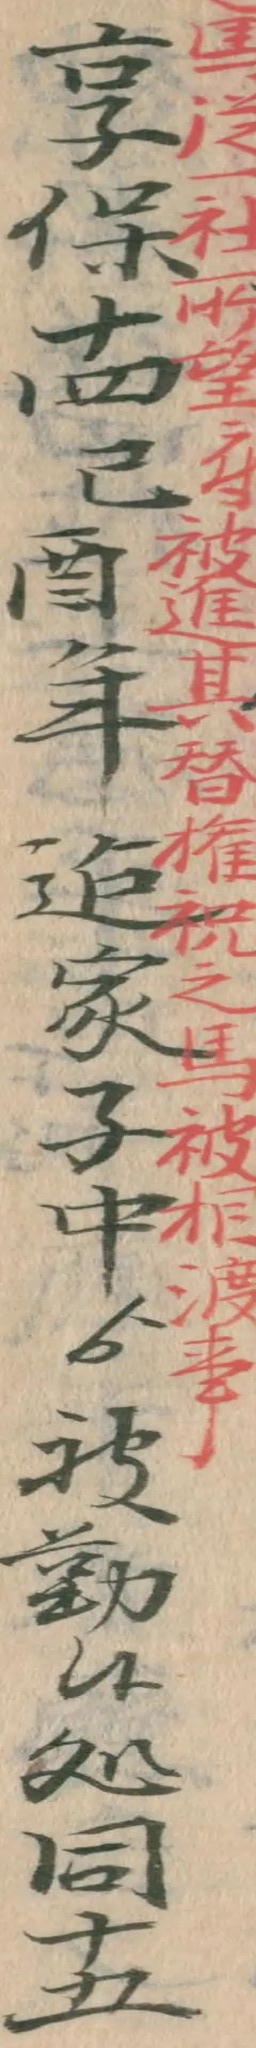享保十四己酉年迄家子中ゟ被勤候処同十五
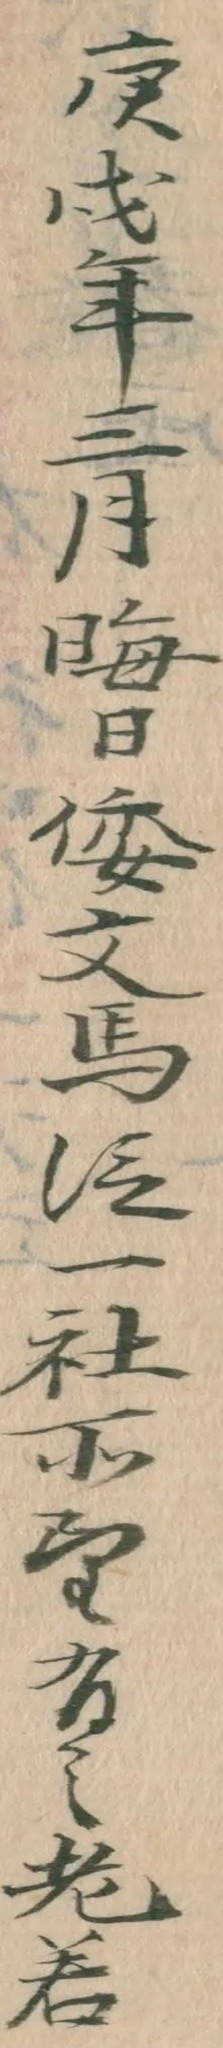庚戌年三月晦日倭文馬従一社所望有之老若
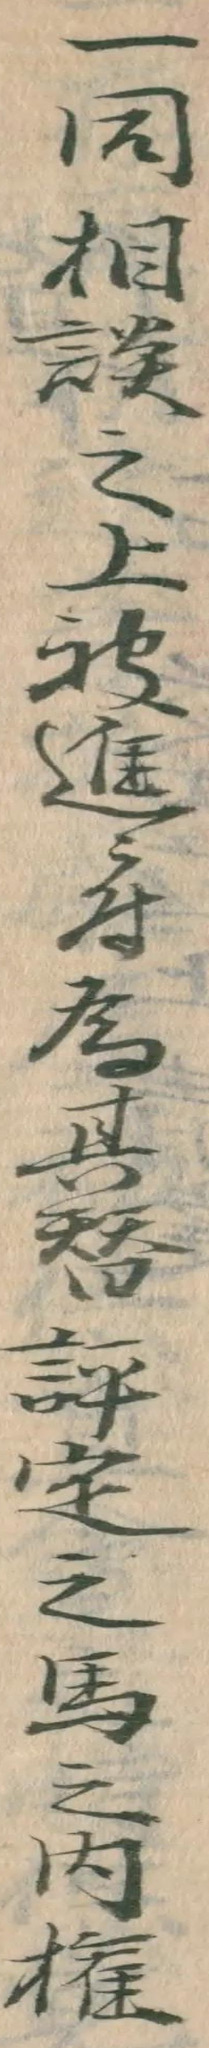一同相談之上被進ニ付為其替評定之馬之内権
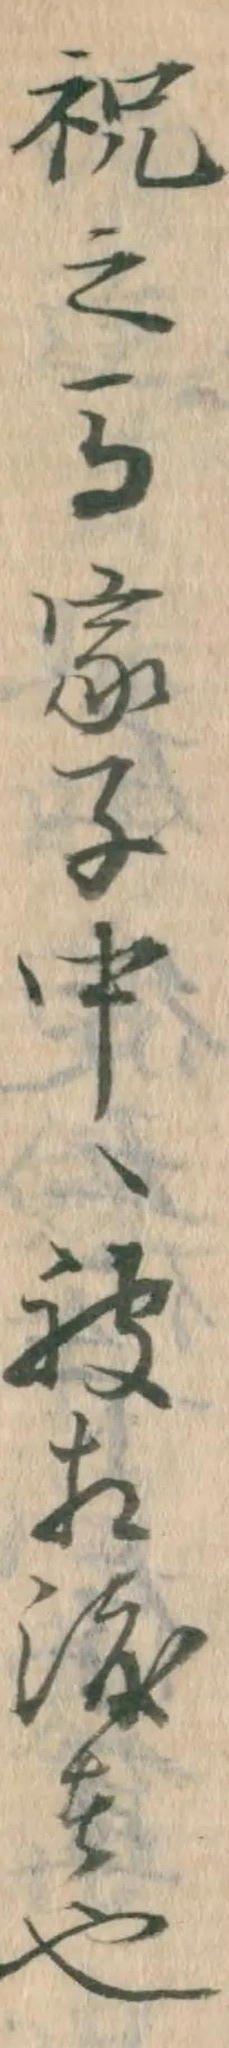祝之馬家子中へ被相渡者也
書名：賀茂社記録. 第10冊
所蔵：国立国会図書館 National Diet Library, JAPAN
